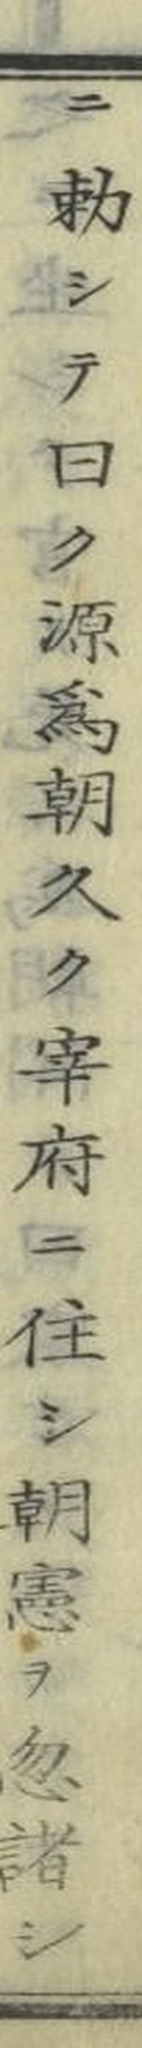ニ勅シテ曰ク源爲朝久ク宰府ニ住シ朝憲ヲ忽諸シ
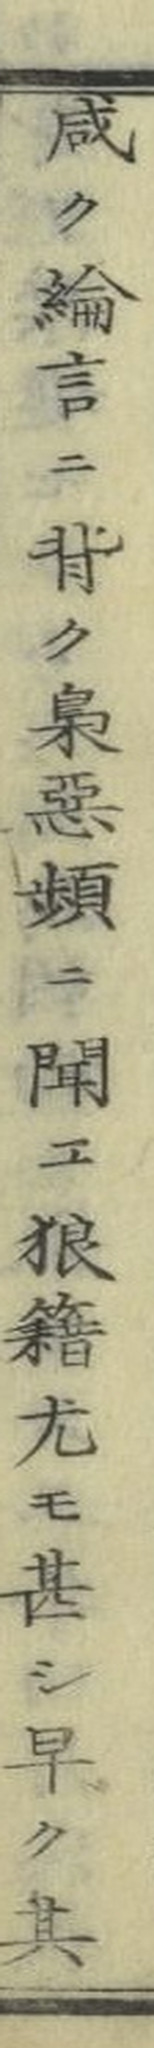咸ク綸言ニ背ク梟惡頻ニ聞エ狼藉尤モ甚シ早ク其

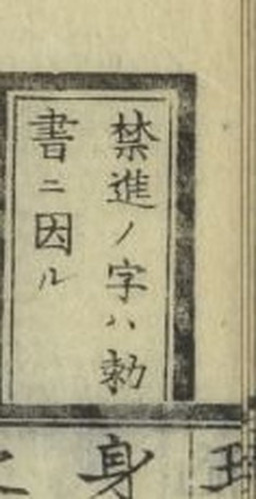禁進ノ字ハ勅
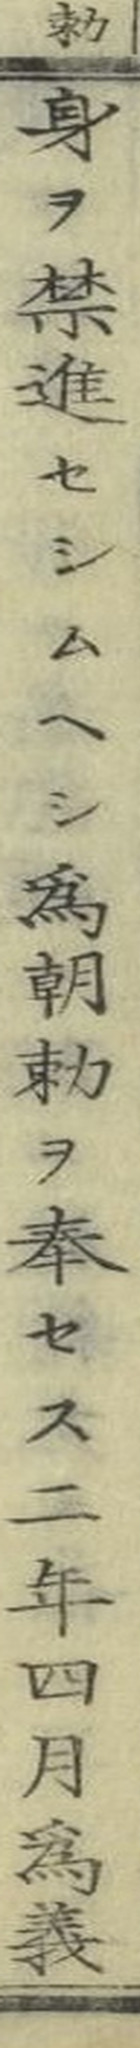身ヲ禁進セシムヘシ爲朝勅ヲ奉セス二年四月爲義
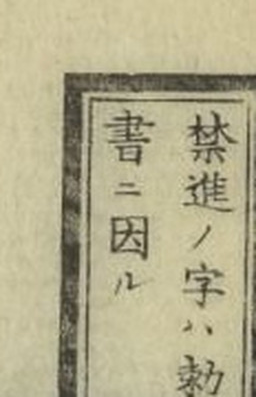書ニ因ル
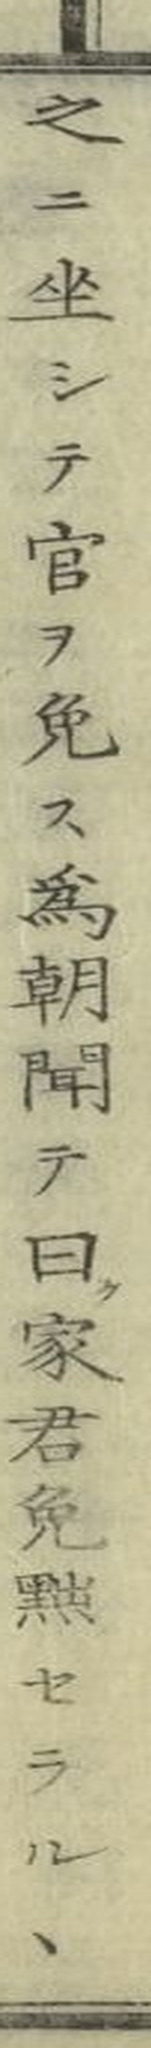之ニ坐シテ官ヲ免ス爲朝聞テ曰家君免黙セラルヽ
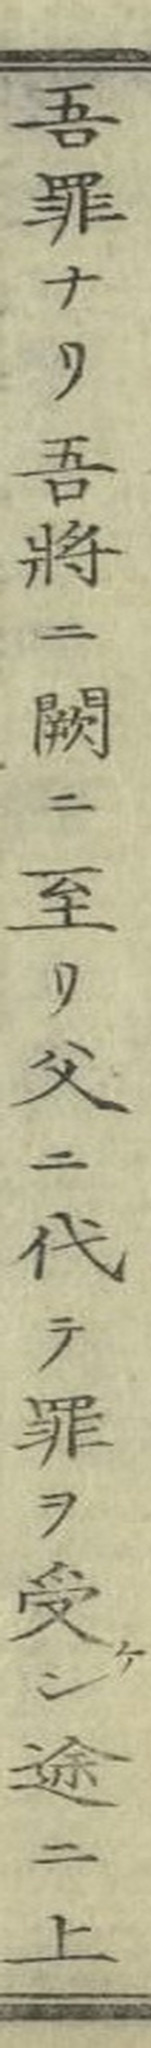吾罪ナリ吾將ニ闕ニ至リ父ニ代テ罪ヲ受ン途ニ上
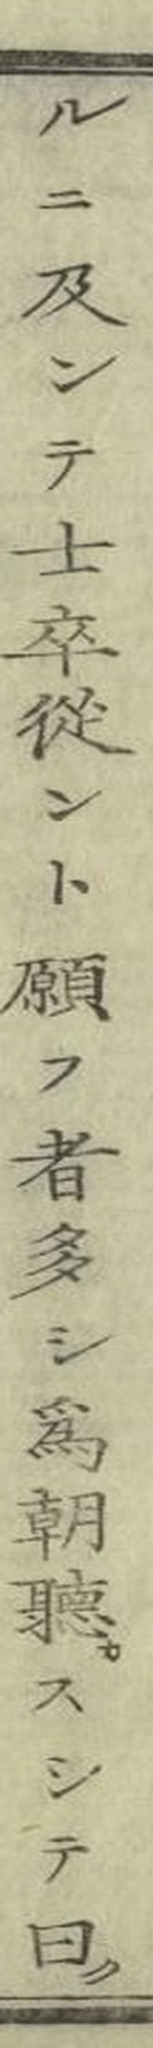ルニ及ンテ士卒從ント願フ者多シ爲朝聽スシテ曰
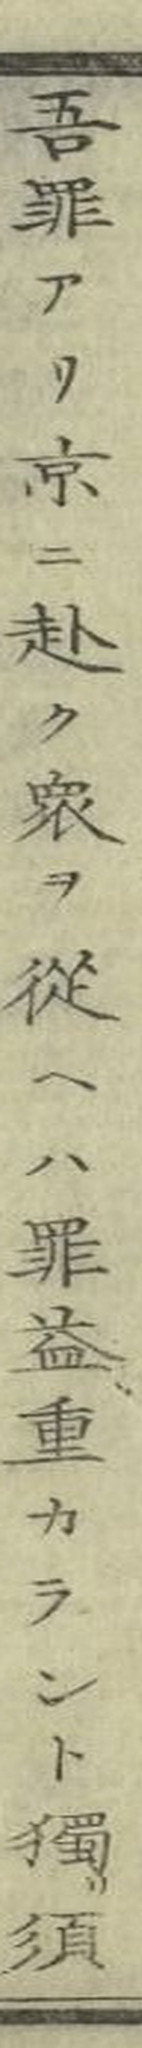吾罪アリ京ニ赴ク衆ヲ從ヘハ罪益重カラント獨須
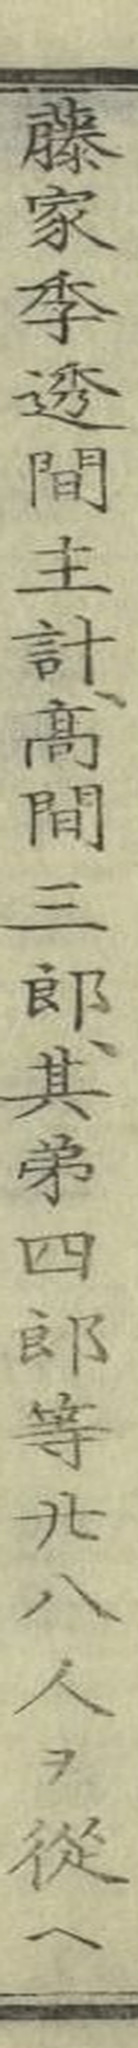藤家李透間主計、髙間三郎、其弟四郎等廿八人ヲ從ヘ
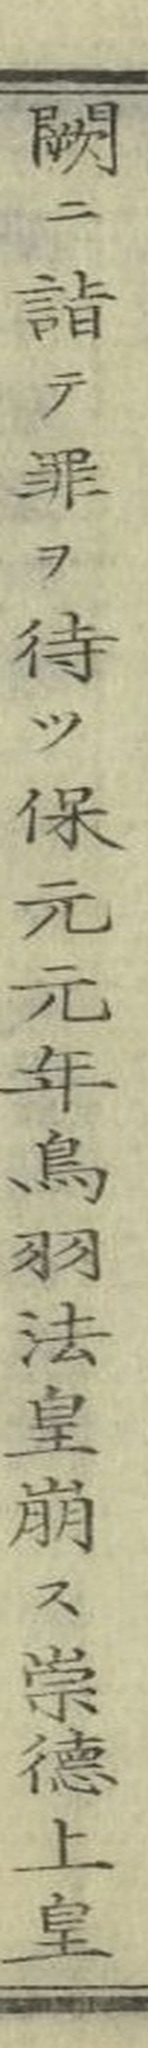闕ニ諸テ罪ヲ待ツ保元元年鳥羽法皇崩ス崇德上皇
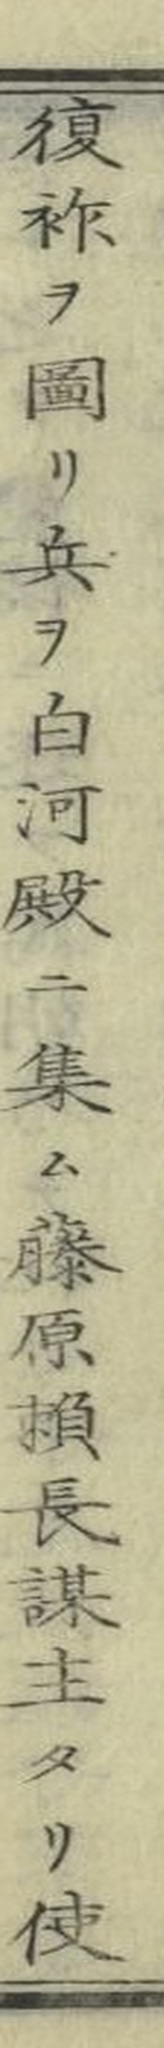復祚ヲ圖リ兵ヲ白河殿ニ集ム藤原頼長謀主タリ使
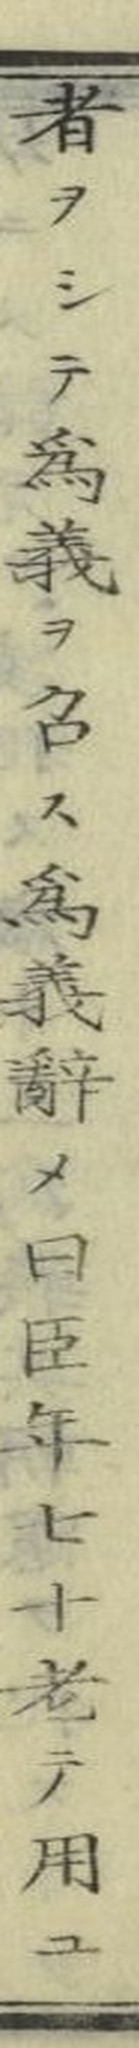者ヲシテ爲義ヲ召ス爲義辭乄曰臣年七十老テ用ユ
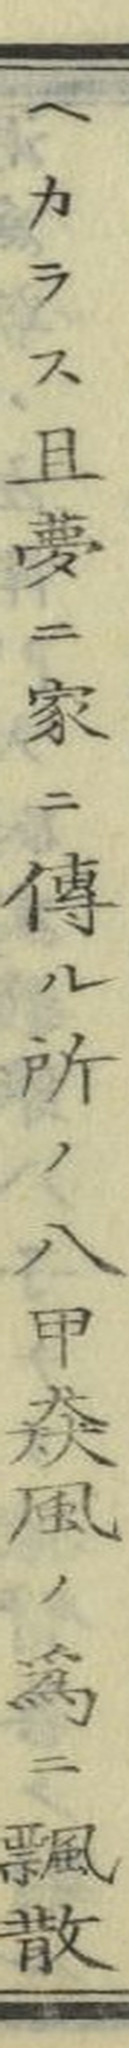ヘカラス且夢ニ家ニ傳ル所ノ八甲猋風ノ爲ニ飄散
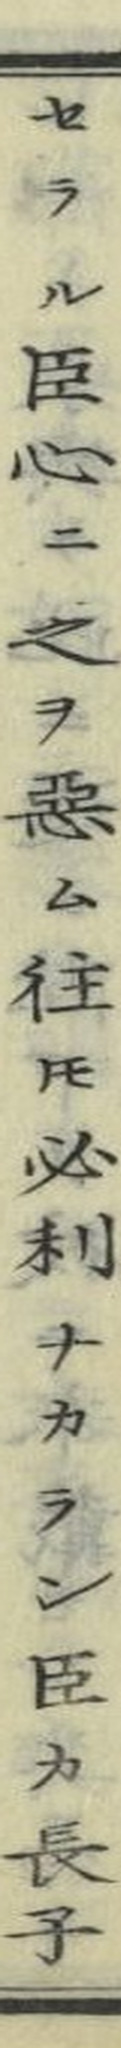セラル臣心ニ之ヲ惡ム往トモ必利ナカラン臣カ長子
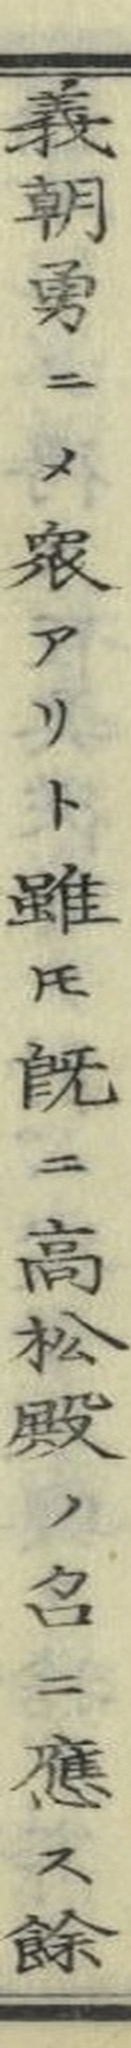義朝勇ニ乄衆アリト雖トモ既ニ高松殿ノ召ニ應ス餘
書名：琉球藩史 一之巻
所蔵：University of the Ryukyus Library
